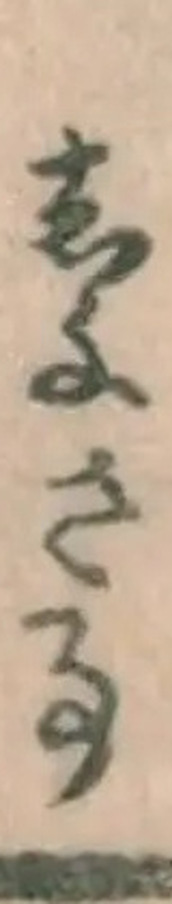しよさ事
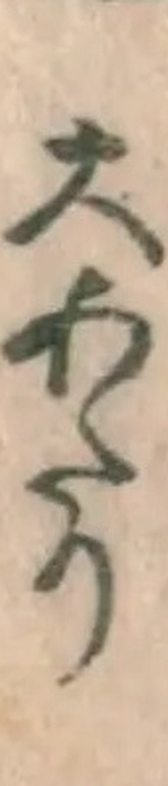大あたり
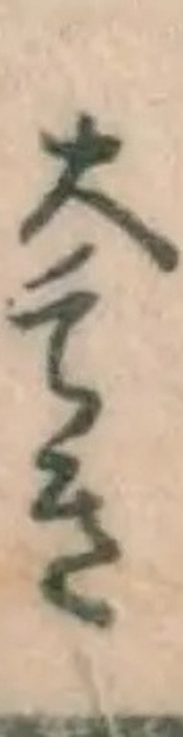大てき
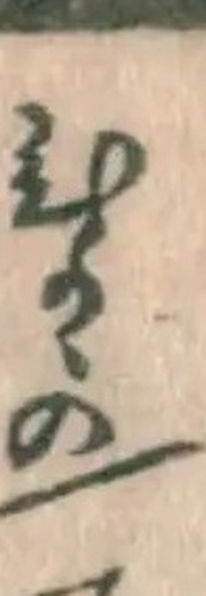ひよくの
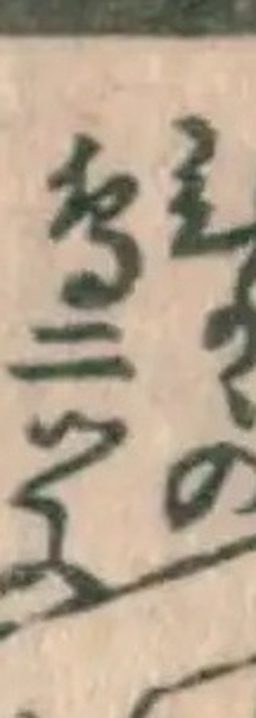鳥二つに
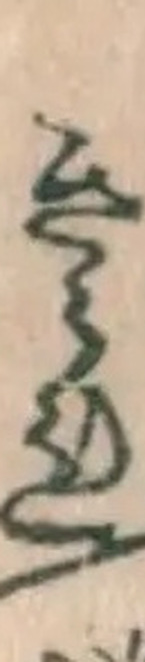きられ
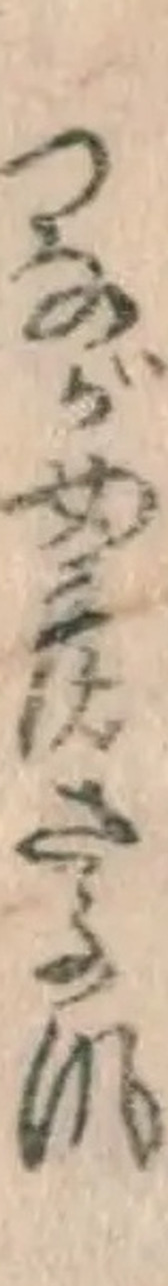つなが女房さよ風
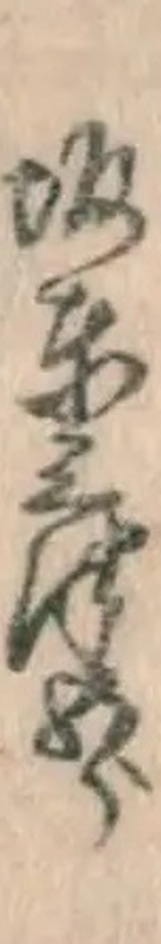坂東三津五郎
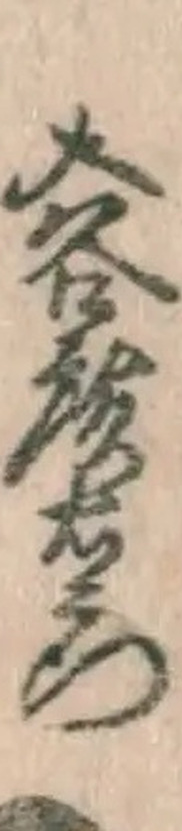大谷広右衛門
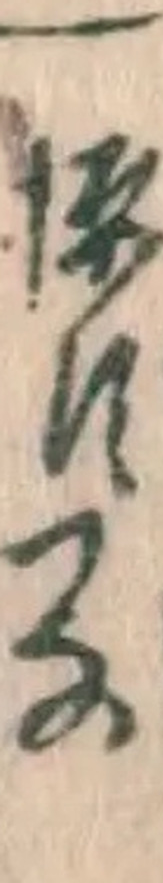源治つな
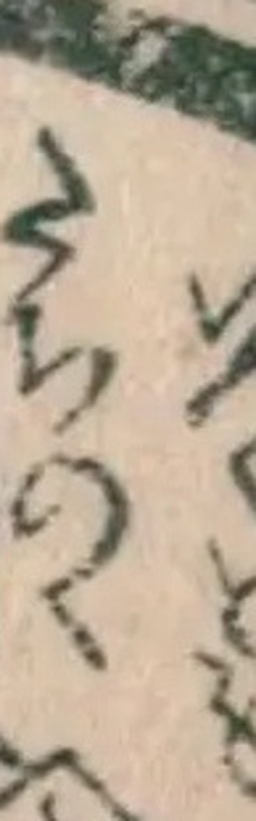たちのく
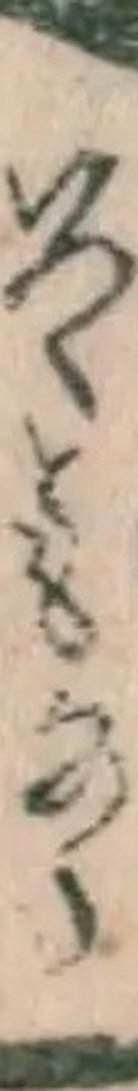いつくともなく
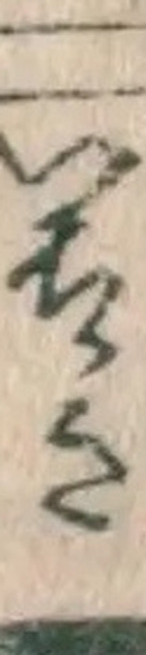いはらき
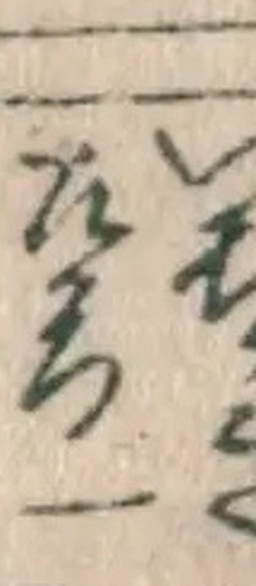左衛門
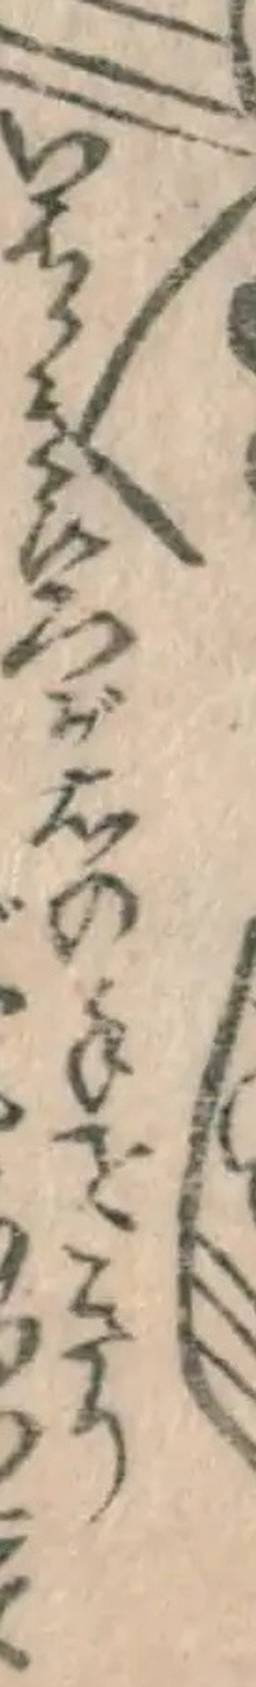いはらき左衛門が右の手をきり
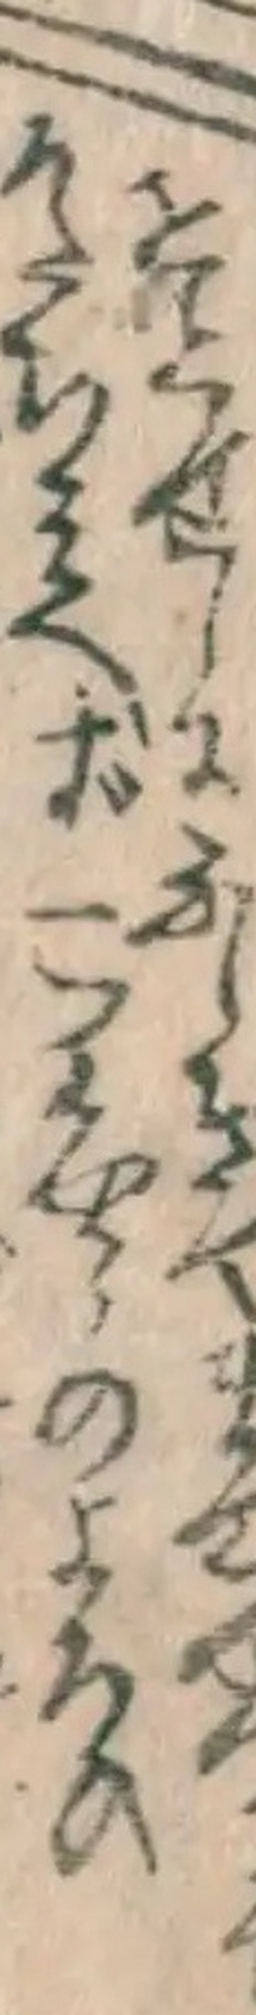かたちみへずこやうのよろひ
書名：菊慈童酒宴岩窟
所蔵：国立国会図書館 National Diet Library, JAPAN
